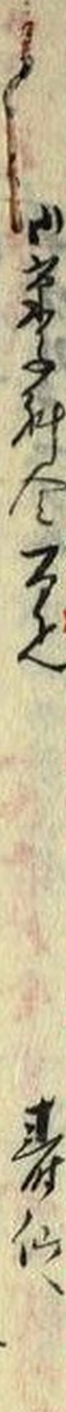御菓子料金百疋寿仙へ
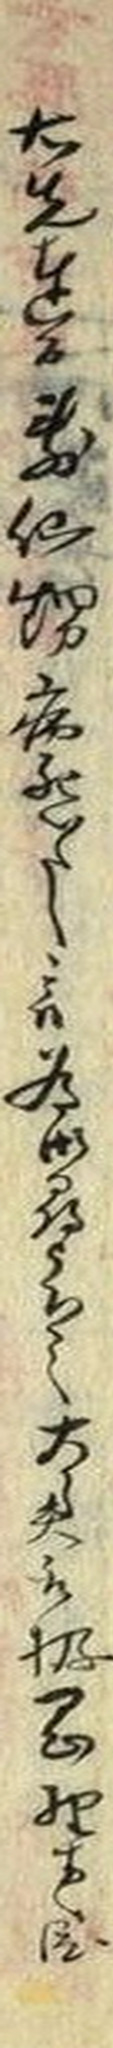右先達而寿仙甥病死いたし候ニ付為御尋被下之大奥取扱岡野方へ渡
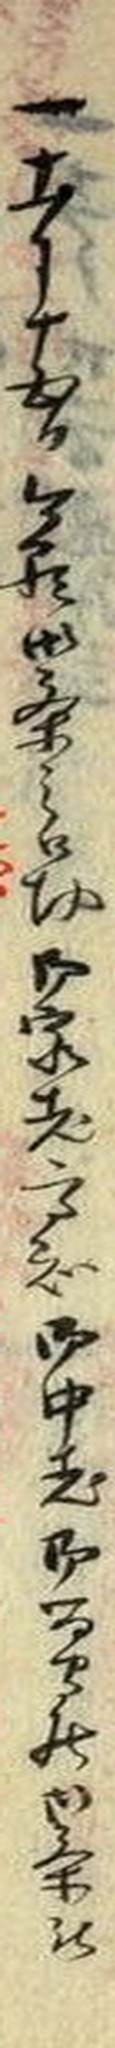一十一月十五日今朝御茶之口切御家老高知御中老御留守居御茶被
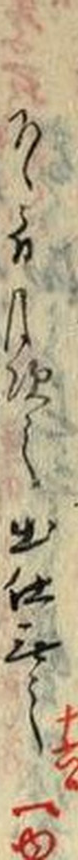下候ニ付月次之出仕無之
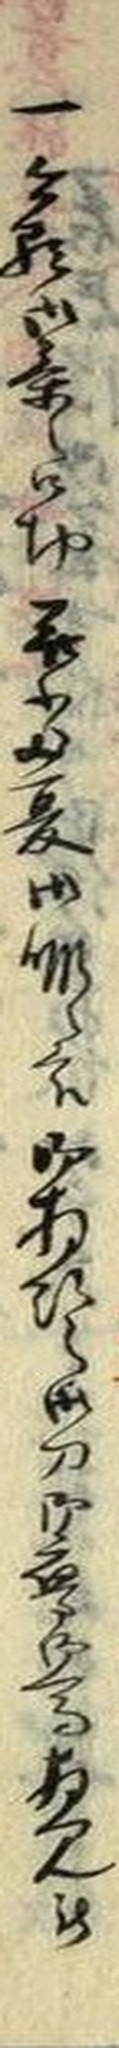一今朝御茶之口切幷当夏御暇之節御拝領之御刀御鷹御馬拝見被
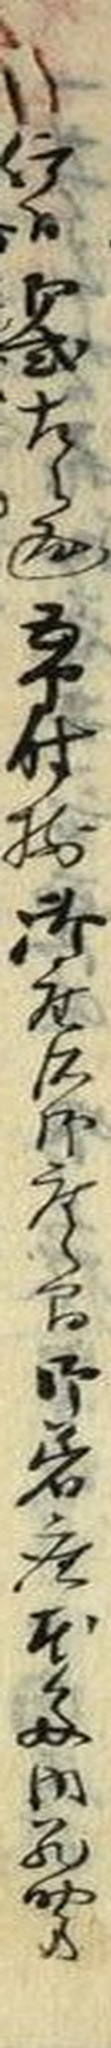仰付御式左之通五半時揃御座所御座之間御着座本多内蔵助方
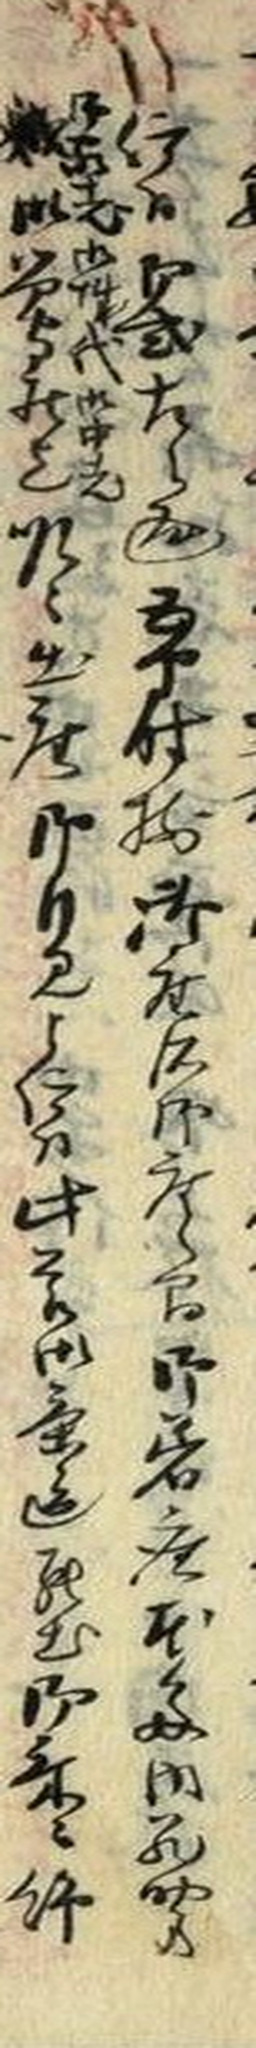御家老御城代御中老御留守居迄順々出座御目見被仰付此節御茶道罷出御床ニ飾
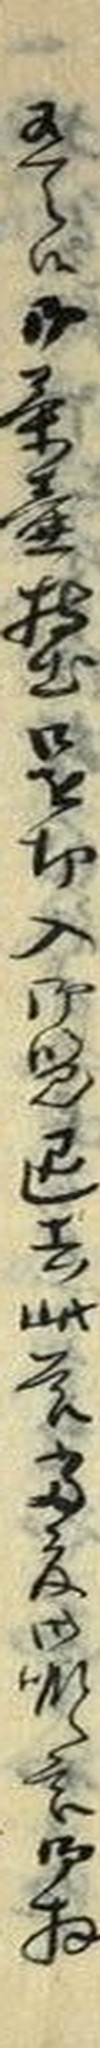有之候御茶壺持出口を切入御覧退去此節当夏御暇之節御拝
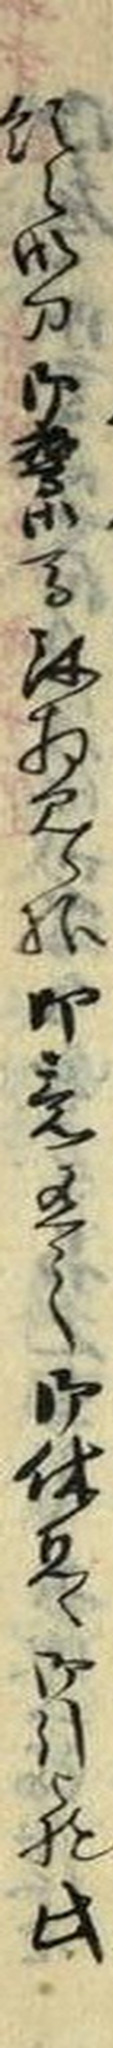領之御刀御鷹御馬致拝見候様御意有之御休息へ御引被遊此
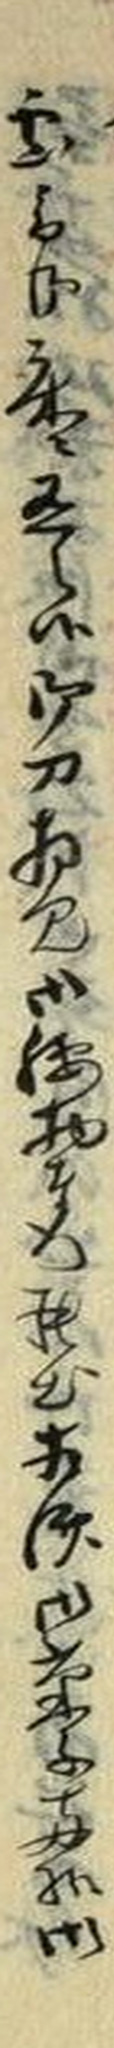処ニ而御床ニ有之候御刀拝見御腰物奉行罷出相済御菓子両様御

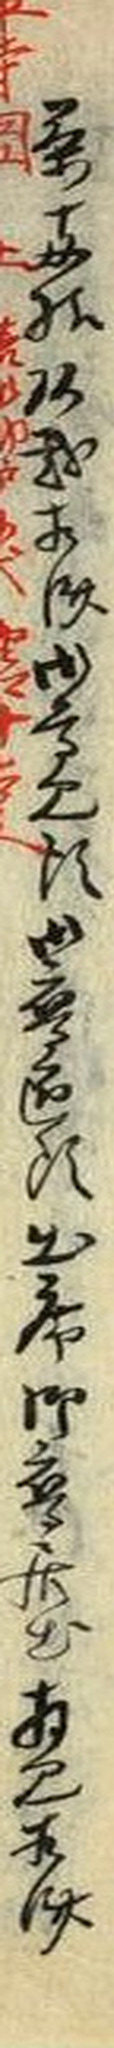茶両様頂戴相済御鳥見頭御鷹匠頭出席御鷹居出拝見相済
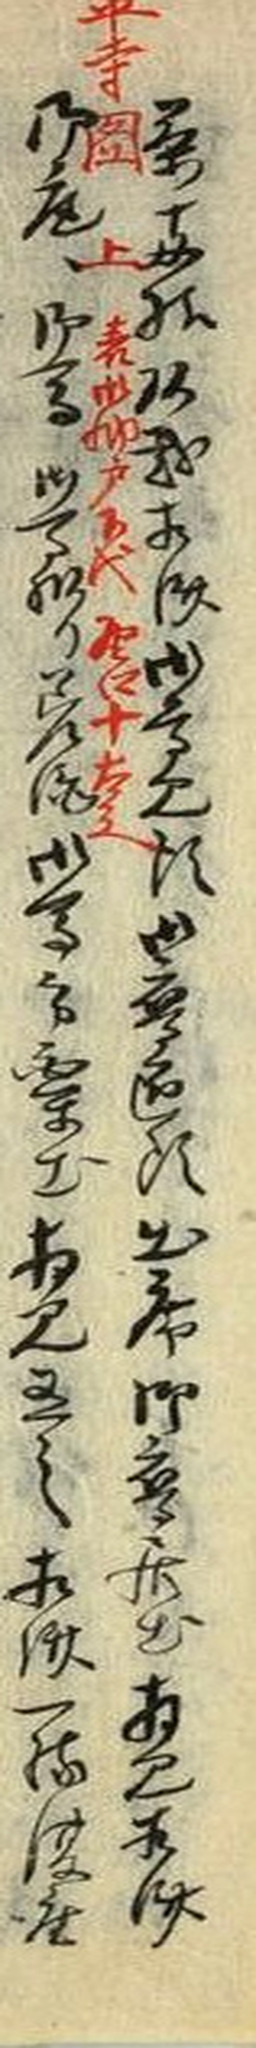御庭へ御馬御馬掛り差添御馬方牽出拝見有之相済一統復座
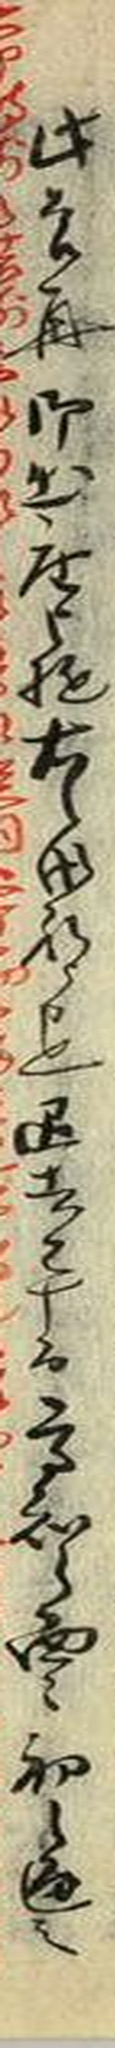此節再御出座被遊右之御礼被申上退去畢而高知之面々初之通之
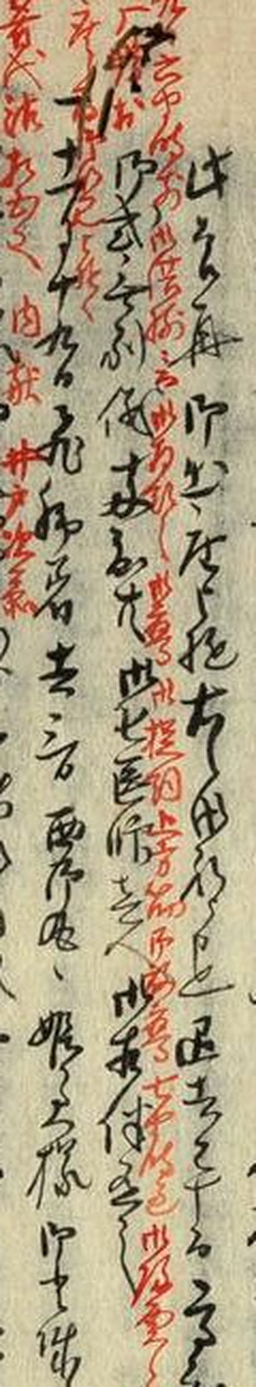御式無別儀両度共御匙医師壱人御相伴有之
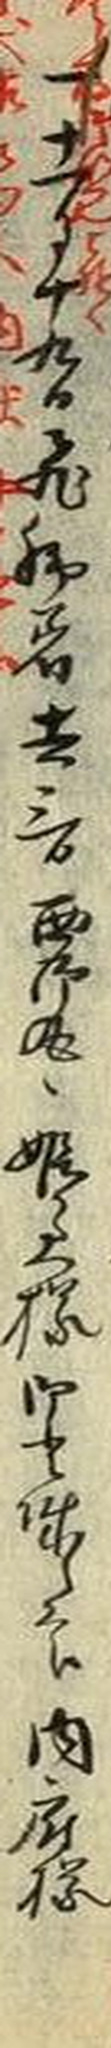一十一月十九日飛脚着去三日西御丸へ姫君様御登城之節内府様
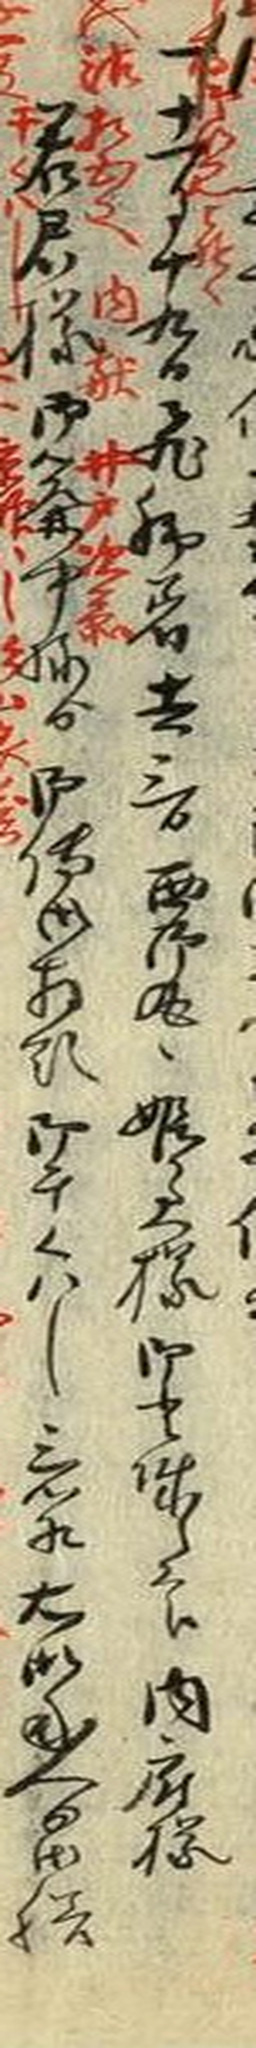若君様御簾中様ゟ御伝御拝領御干くハし三箱右御用人ゟ御膳
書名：少傅日録抄（斉承付側向頭取日記、在国）
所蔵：福井県文書館 Fukui Prefectural Archives
